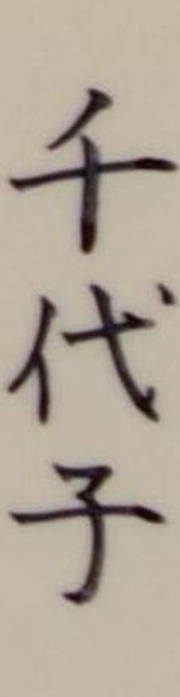千代子
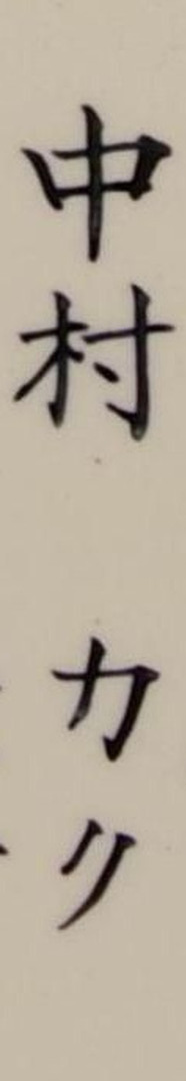中村カク
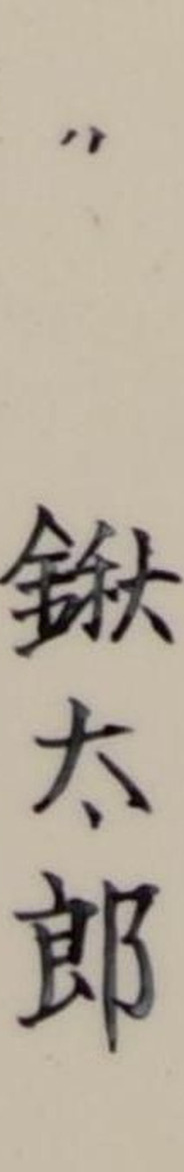鍬太郎
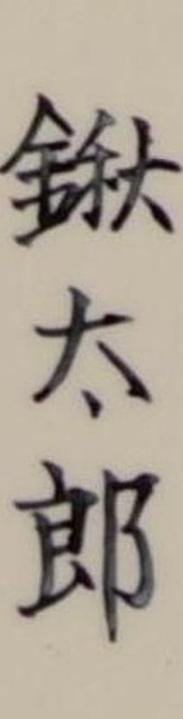鍬太郎
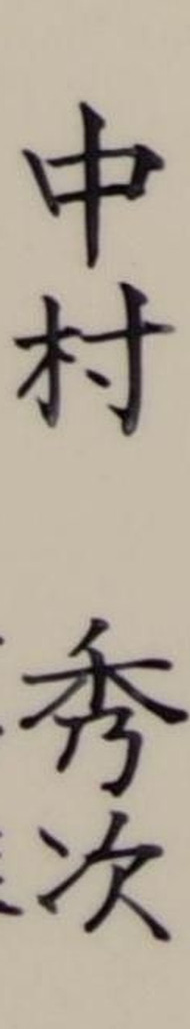中村秀次
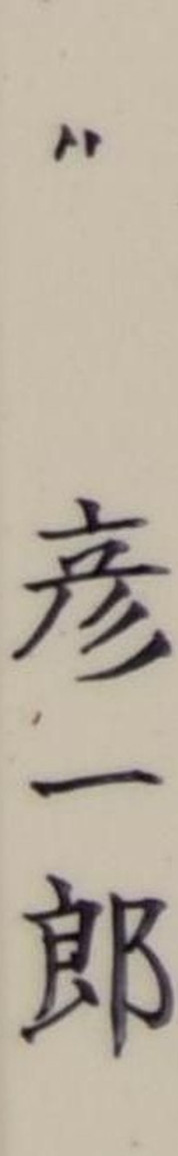彦一郎
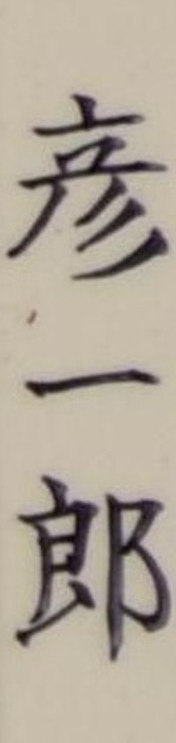彦一郎

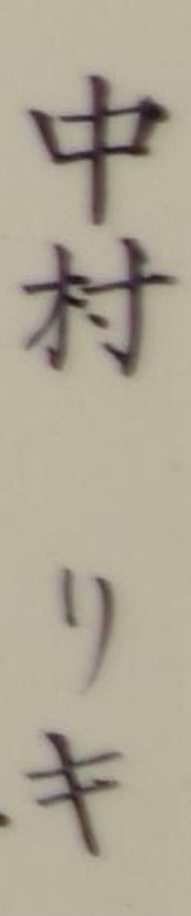中村リキ
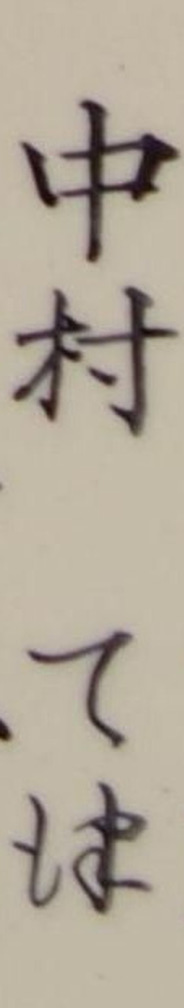中村てつ
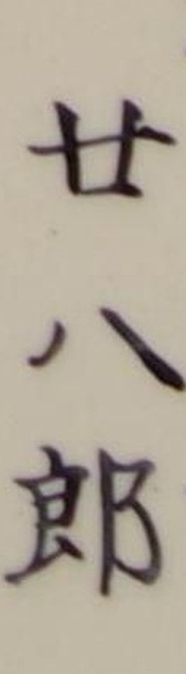廿八郎
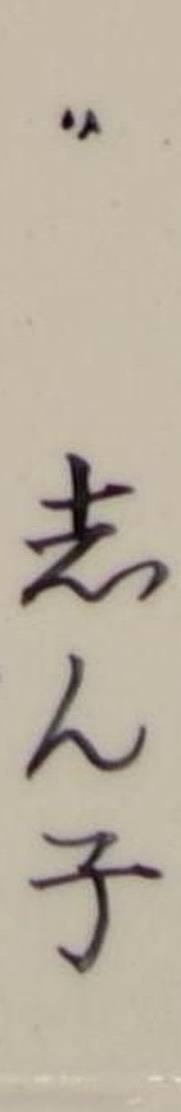しん子
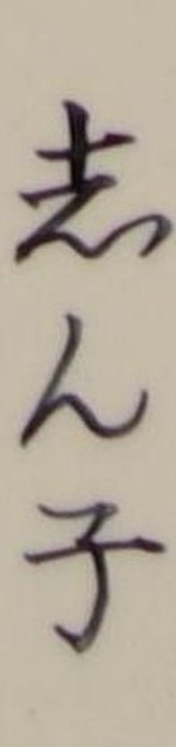しん子
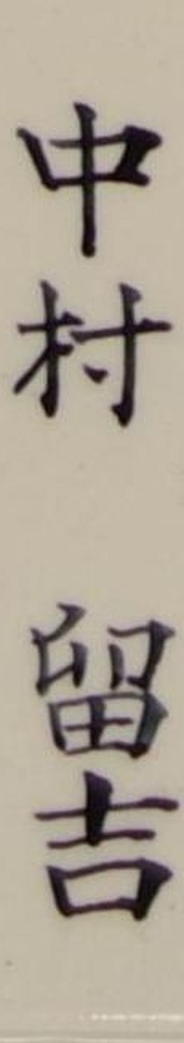中村留吉
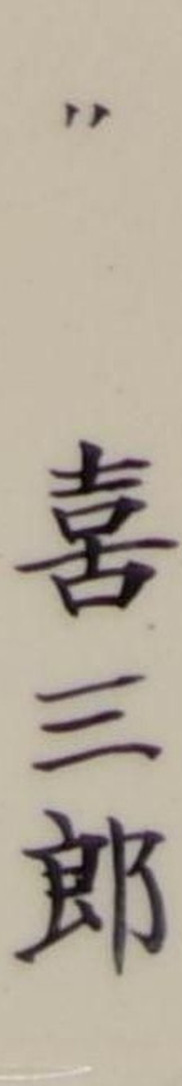喜三郎
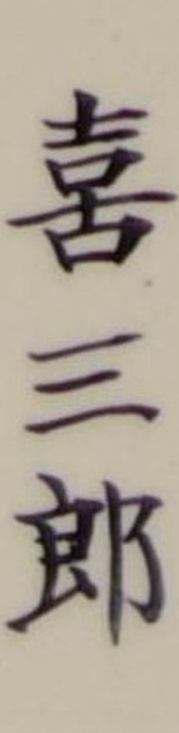喜三郎
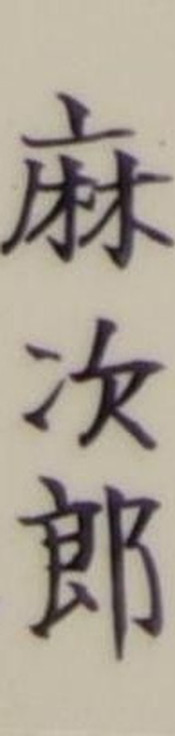麻次郎
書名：E~L
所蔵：高野山金剛峯寺
